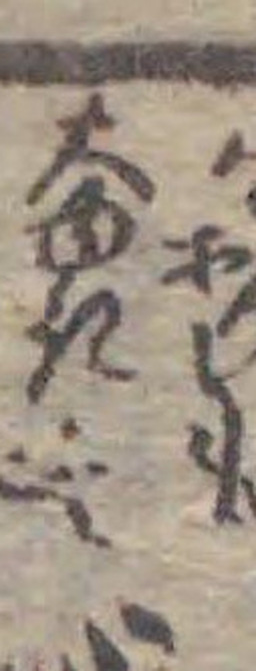大ゆき
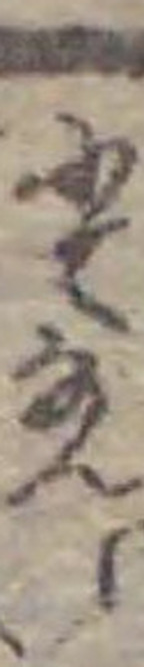にてなん
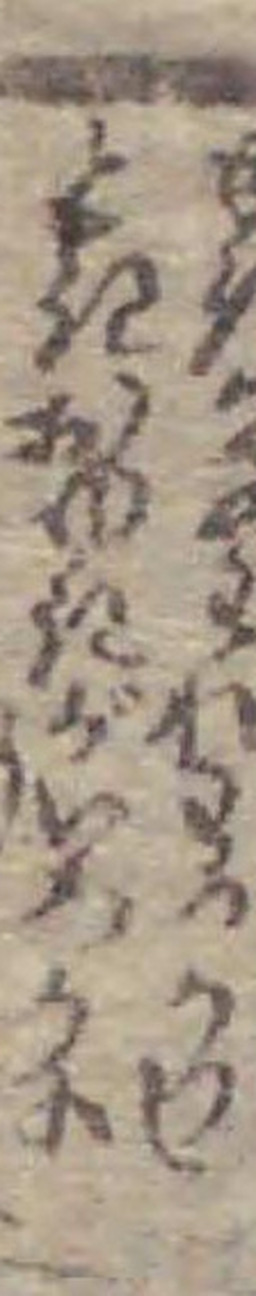ときおゆきがいろかに
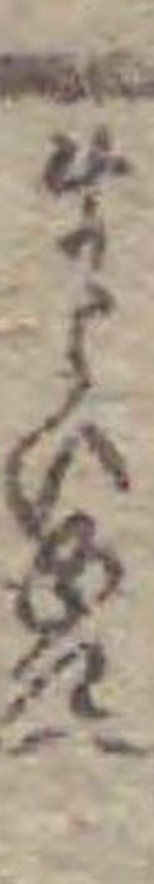まよひゆき
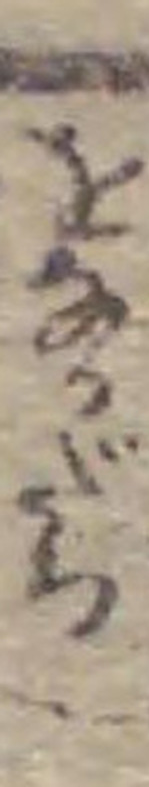をなかだち
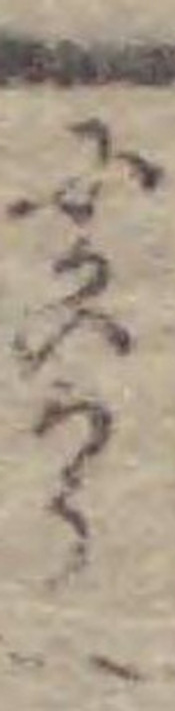にかいかう
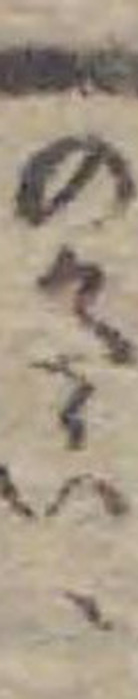のかたらい
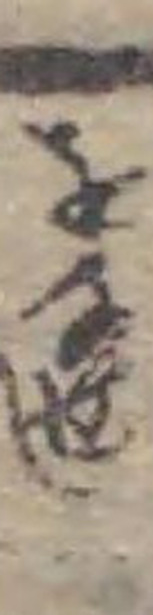をなせし
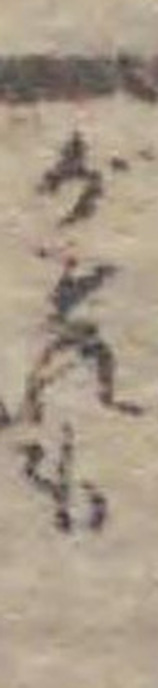がそれも
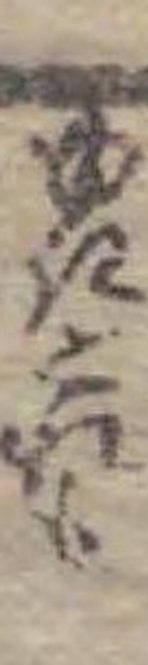ゆきこれも
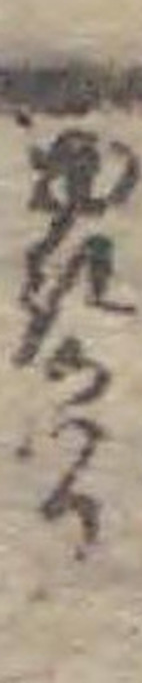ゆきかはり
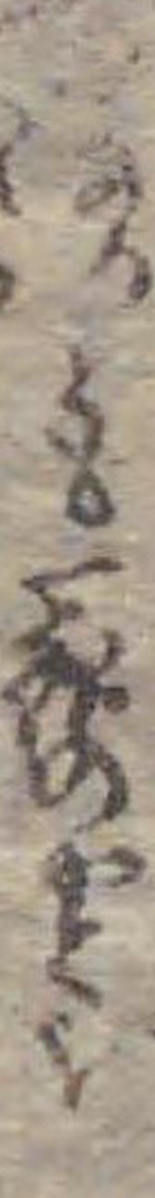になりとも一夜のやとを
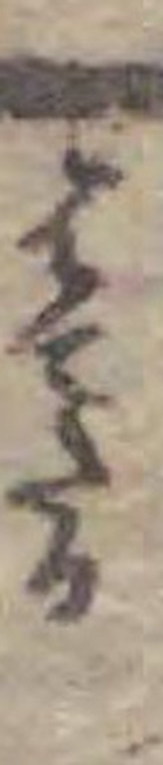はてたる
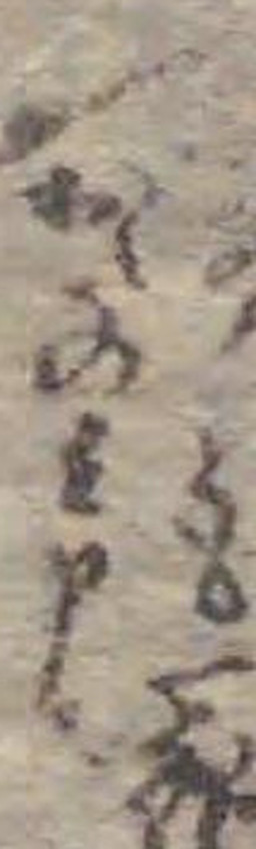おたのみ申
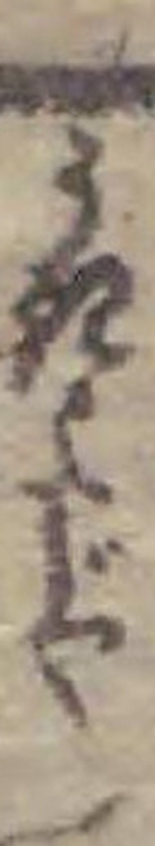うきよじや
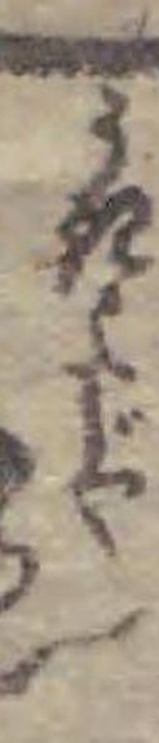うきよじや
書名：[化物一代記] : 5巻
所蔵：国立国会図書館 National Diet Library, JAPAN
